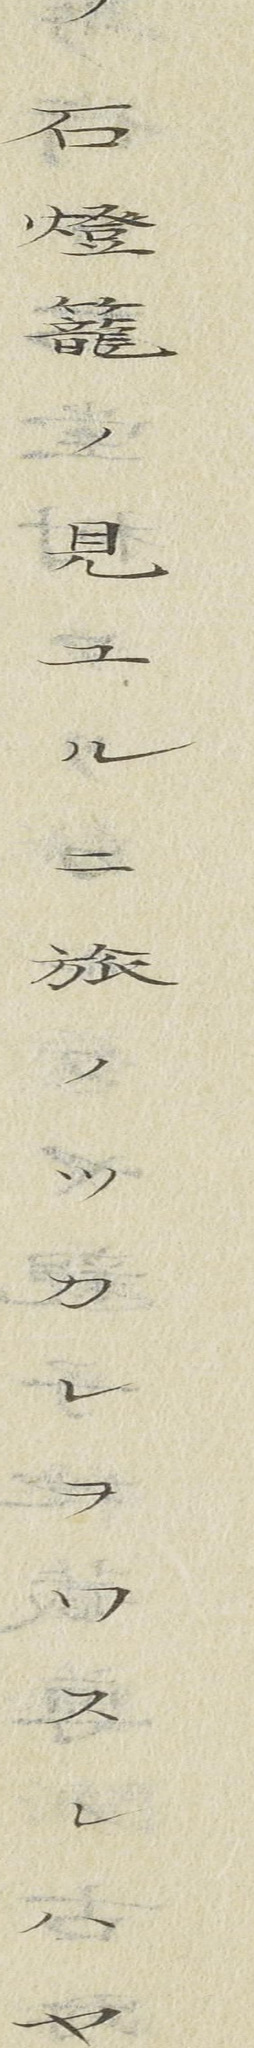ノ石燈篭ノ見ユルニ旅ノツカレヲワスレハヤ
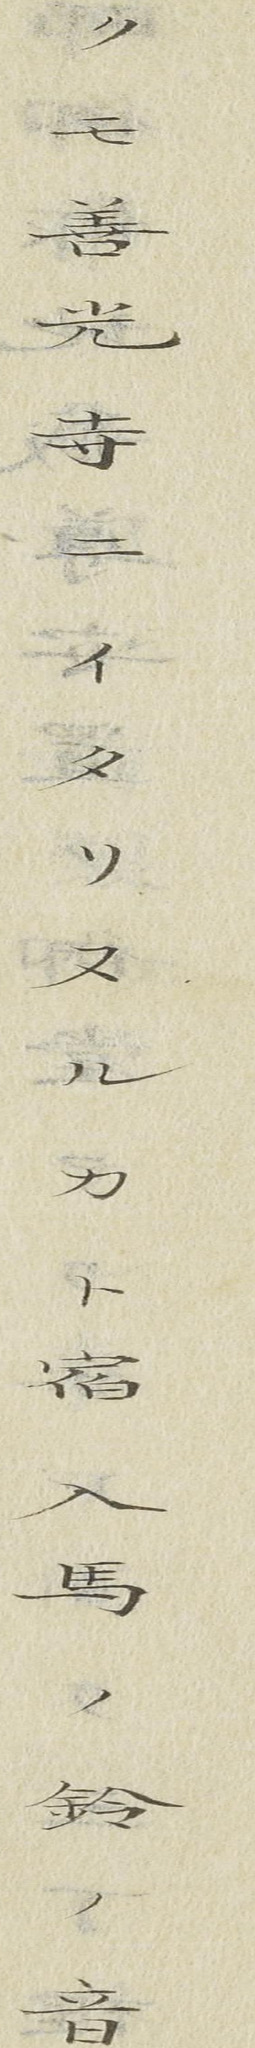クモ善光寺ニイタリヌルカト宿入馬ノ鈴ノ音
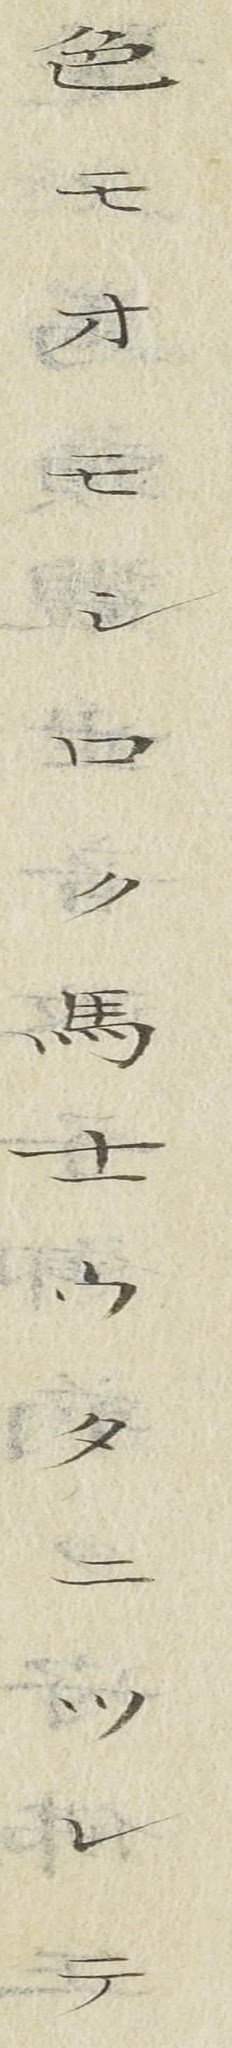色モオモシロク馬士ウタニツレテ
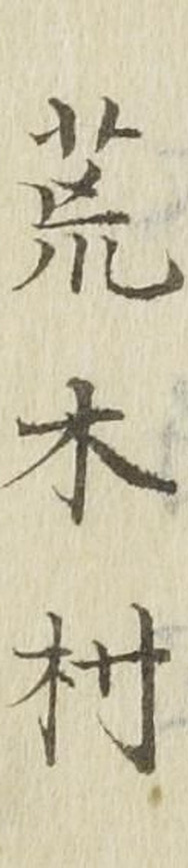荒木村
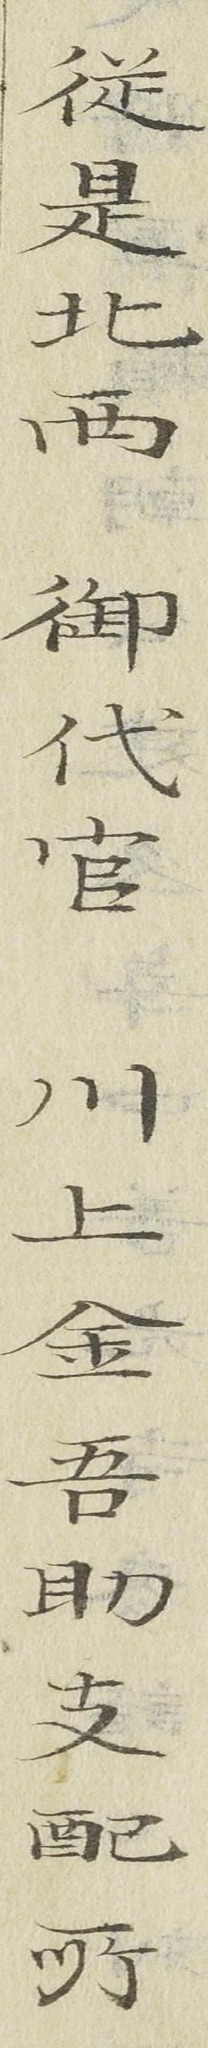従是北西御代官川上金吾助支配所
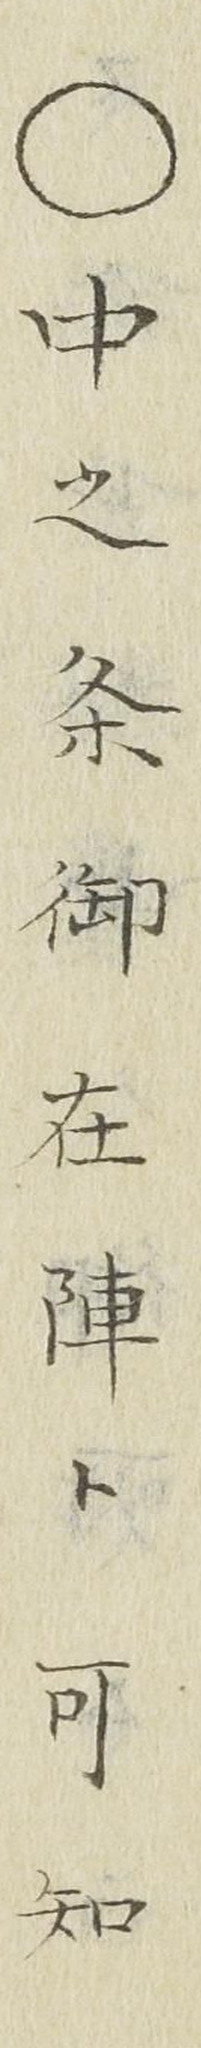〇中之条御在陣ト可知

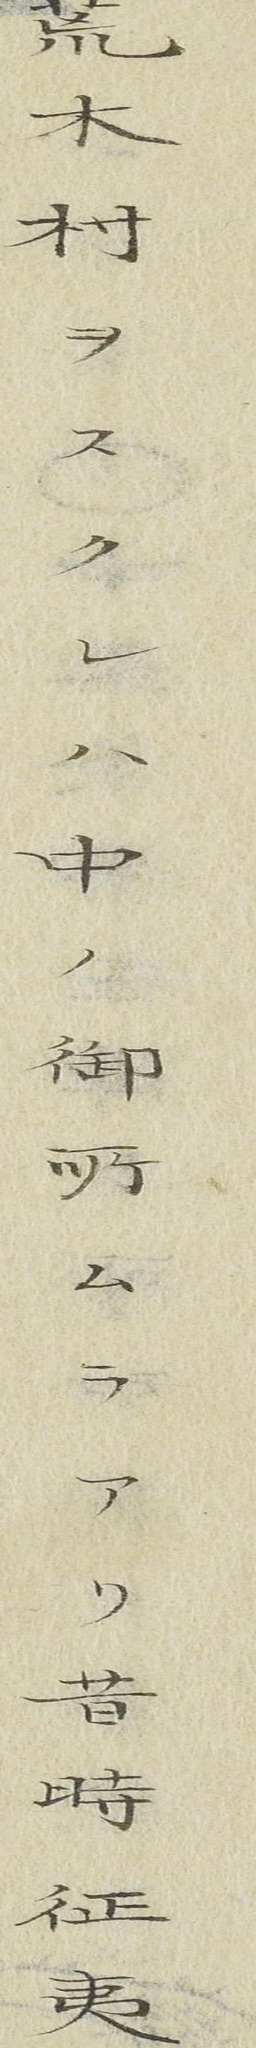荒木村ヲスクレハ中ノ御所ムラアリ昔時征夷
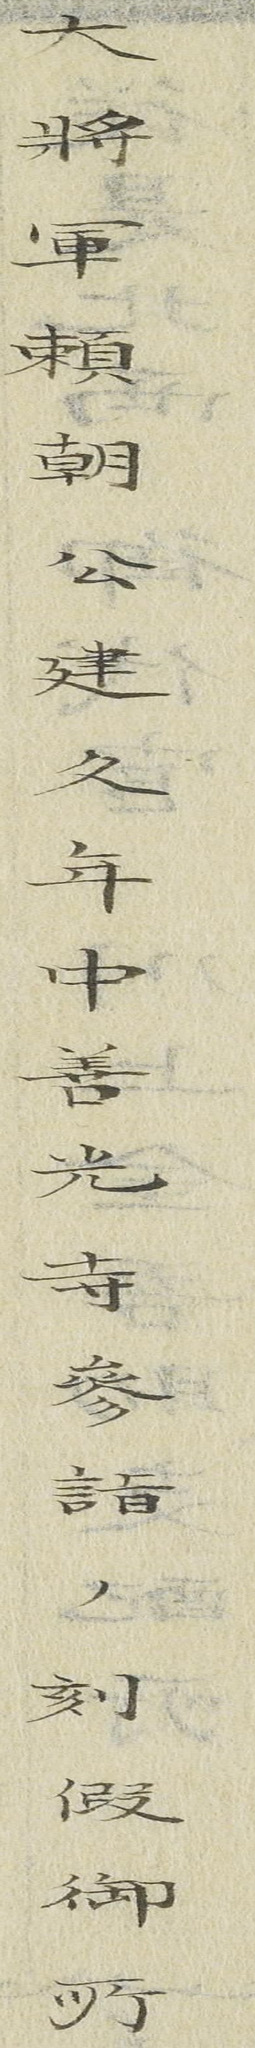大将軍頼朝公建久年中善光寺参詣ノ刻仮御所
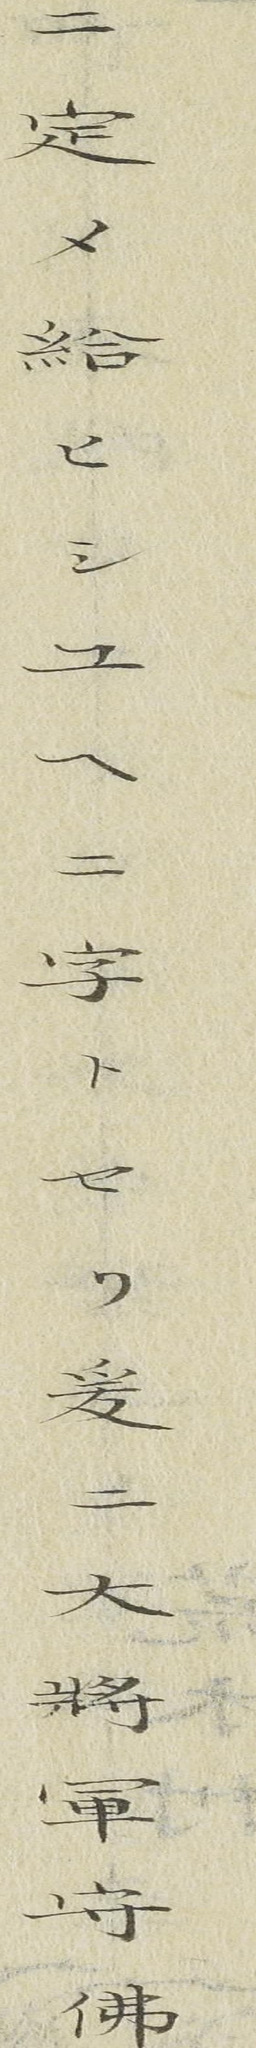ニ定メ給ヒシユヘニ字トセリ爰ニ大将軍守仏
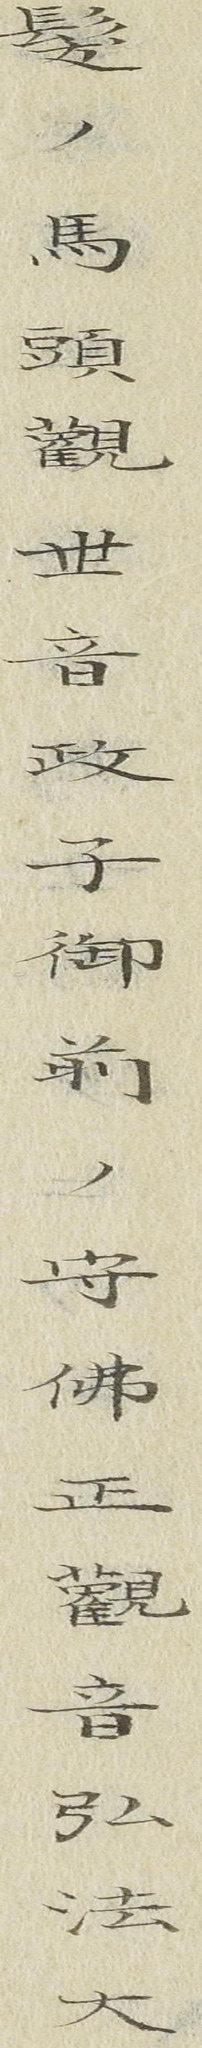髪ノ馬頭観世音政子御前ノ守仏正観音弘法大
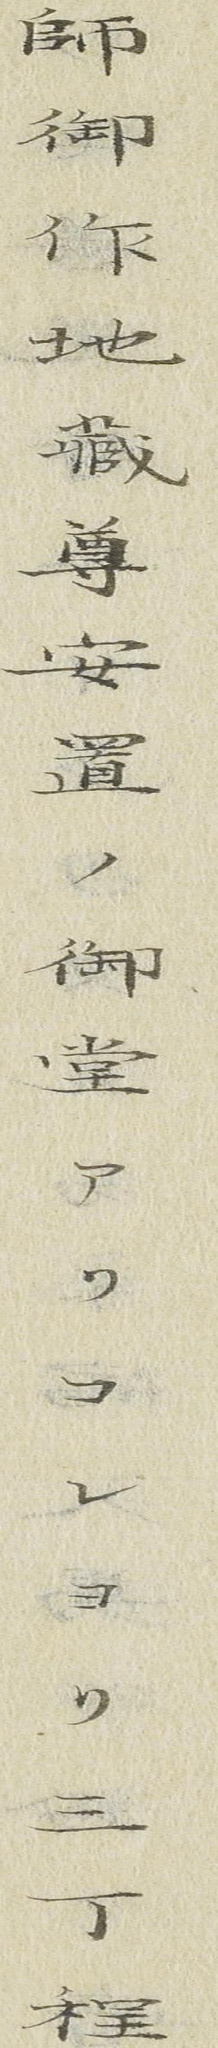師御作地蔵尊安置ノ御堂アリコレヨリ三丁程
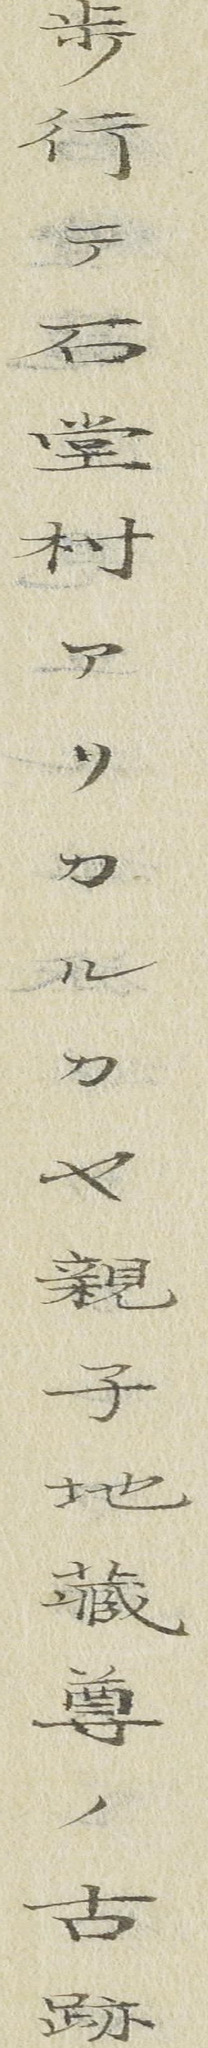歩行テ石堂村アリカルカヤ親子地蔵尊ノ古跡
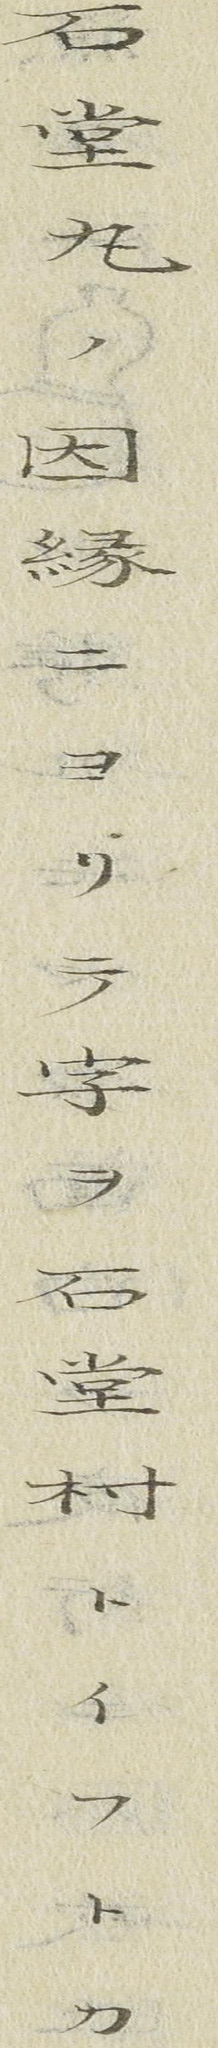石堂丸ノ因縁ニヨリテ字ヲ石堂村トイフトカ
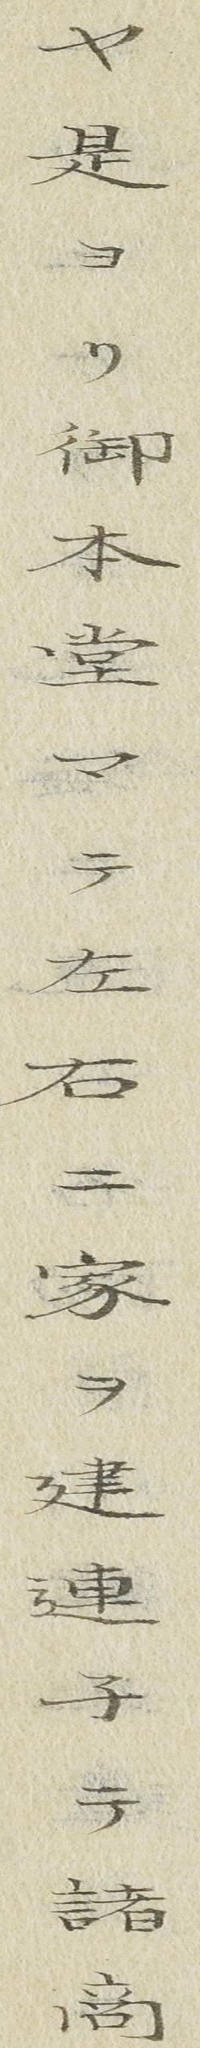ヤ是ヨリ御本堂マテ左右ニ家ヲ建連子テ諸商
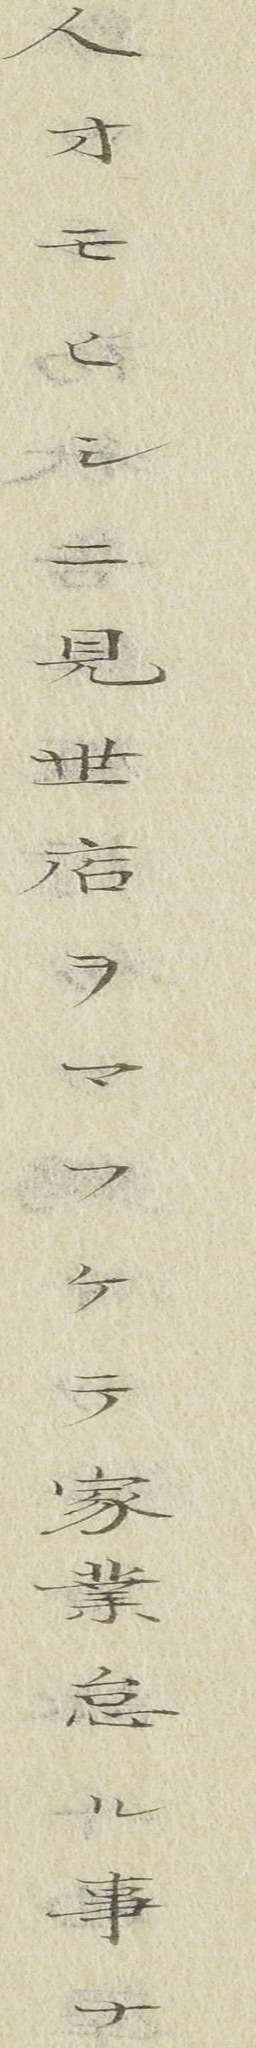人オモヒシニ見世店ヲマフケテ家業怠ル事ナ
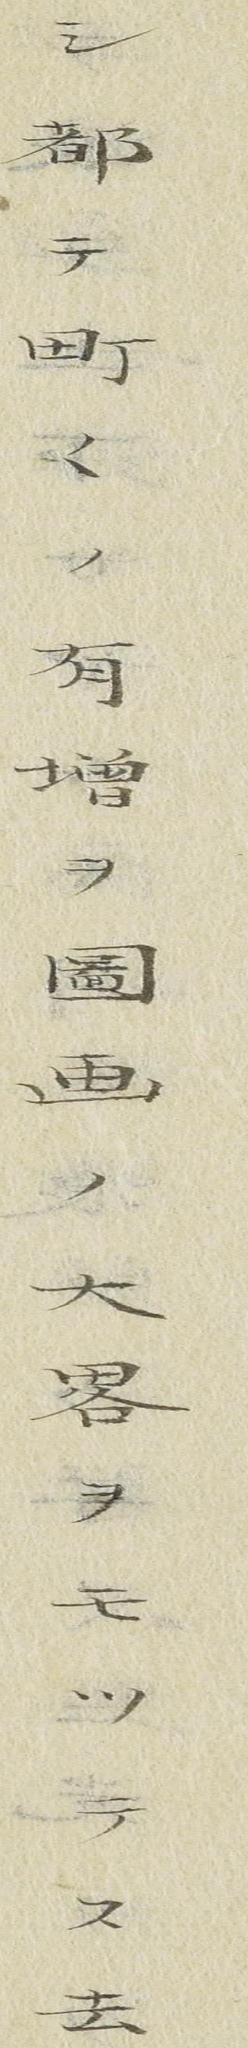シ都テ町〱ノ有増ヲ図画ノ大略ヲモツテス去
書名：地災撮要　地震之部　巻ノ二
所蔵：東京大学地震研究所図書室 Earthquake Research Institute Library, The University of Tokyo, JAPAN
